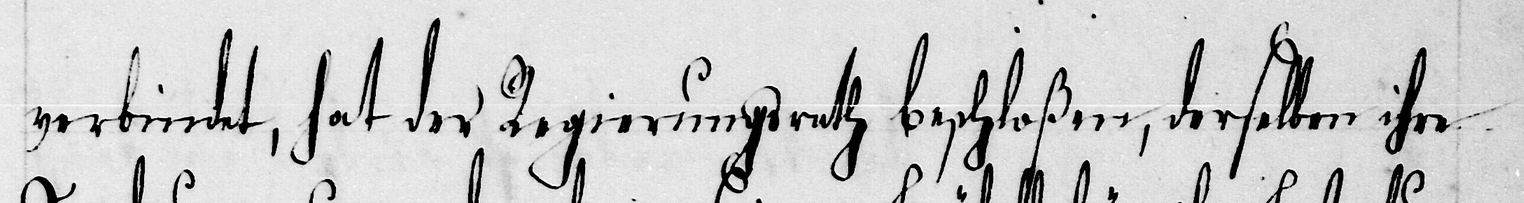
verbindet, hat der Regierungsrath beschloßen, derselben ihre
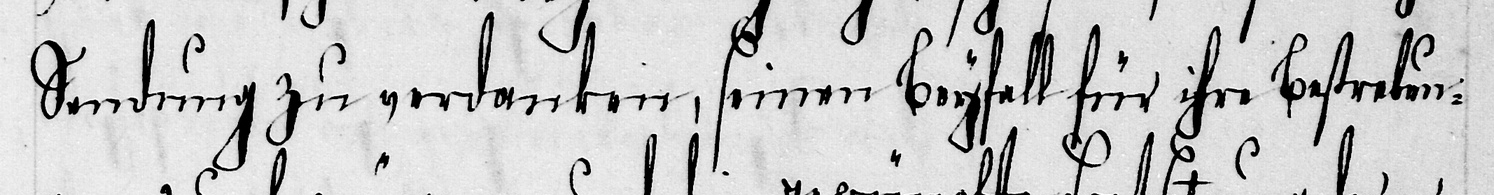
Sendung zu verdanken, seinen Beyfall für ihre Bestrebun¬
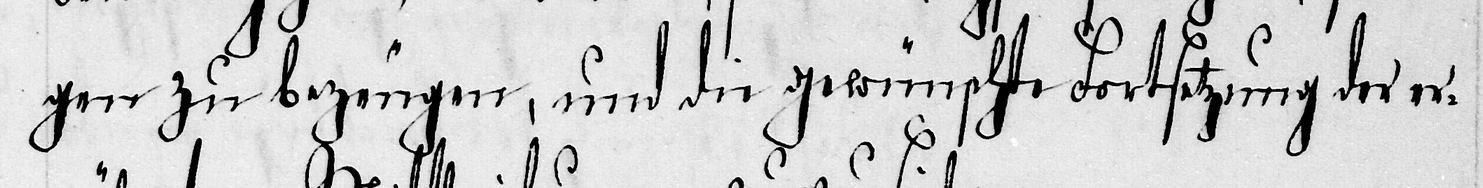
gen zu bezeugen, und die gewünschte Fortsetzung der er¬
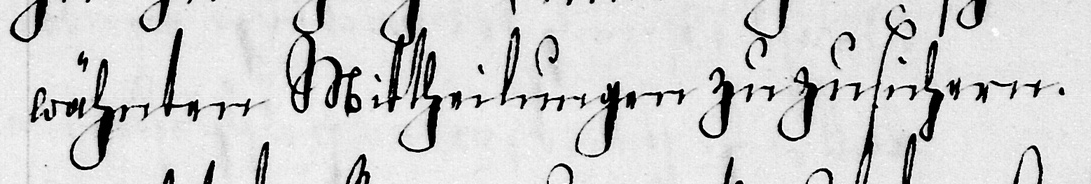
wähnten Mittheilungen zuzusichern.
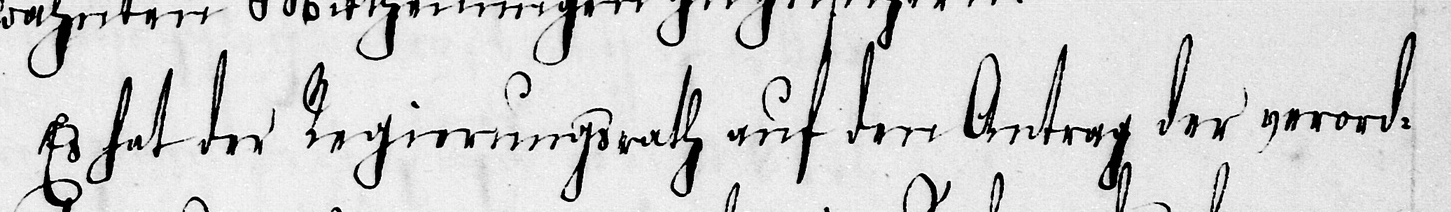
Es hat der Regierungsrath auf den Antrag der verord¬
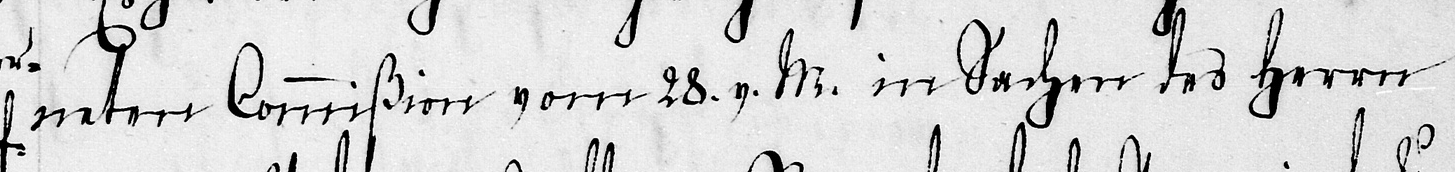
neten Commißion vom 28. v. M. in Sachen des Herrn
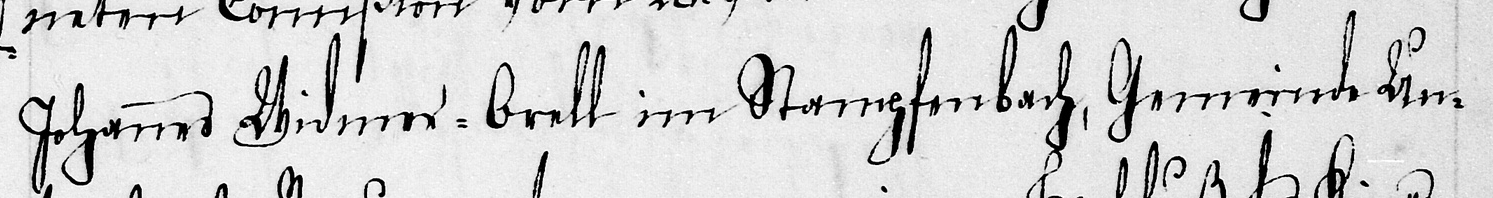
Johannes Widmer-Orell im Stampfenbach, Gemeinde Un¬
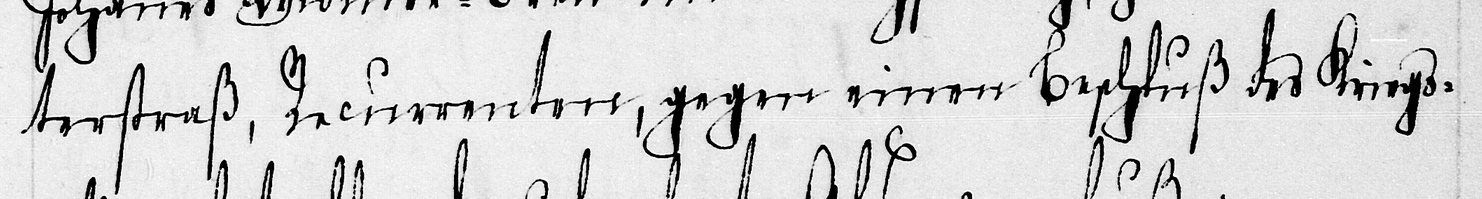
terstraß, Recurrenten, gegen einen Beschluß des Kriegs¬
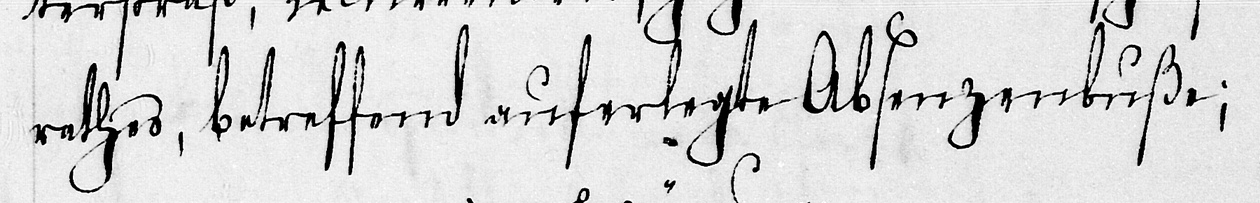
rathes, betreffend auferlegte Absenzenbuße;
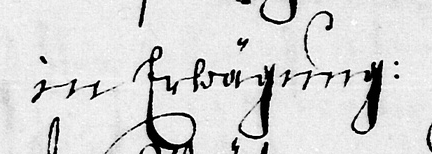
in Erwägung:
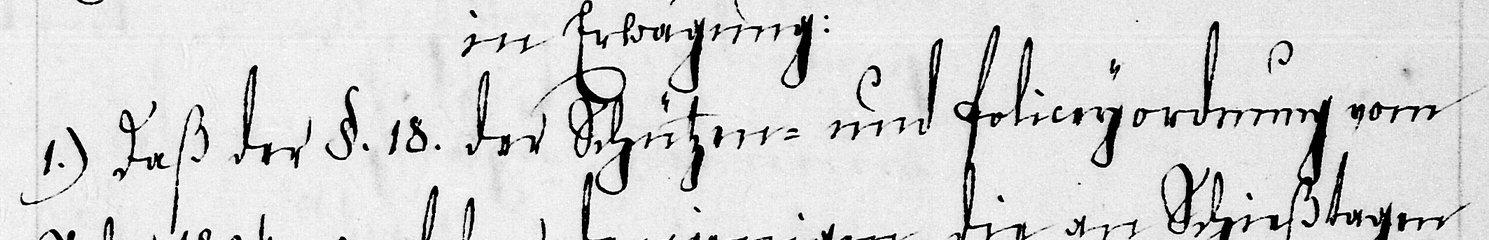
1.) Daß der §. 18. der Schützen- und Policeyordnung vom
